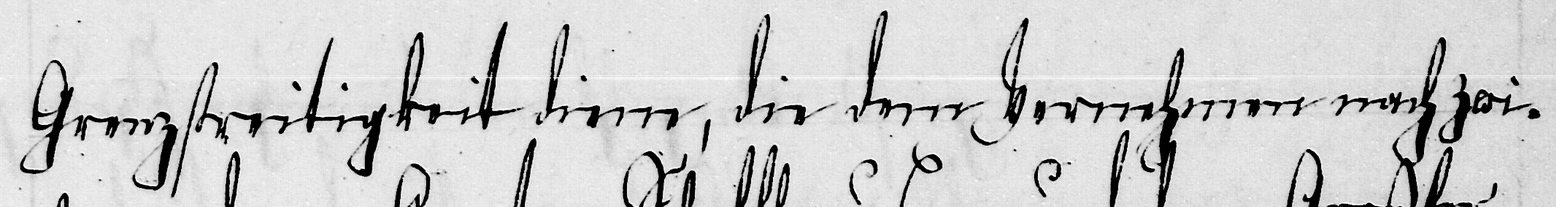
Grenzstreitigkeit diene, die dem Vernehmen nach zwi¬
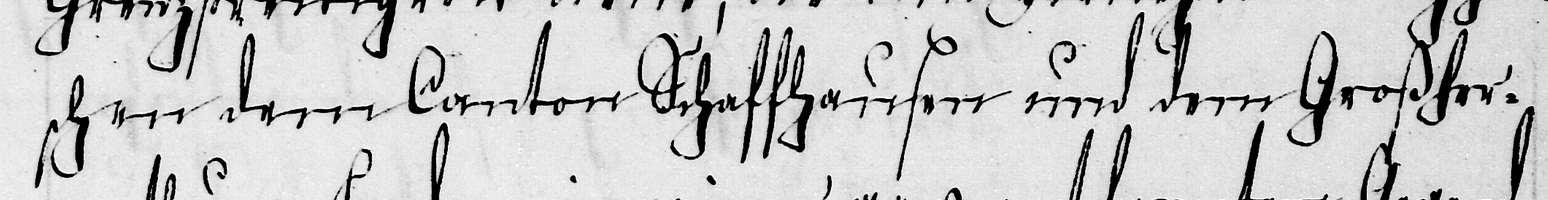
schen dem Canton Schaffhausen und dem Großher¬
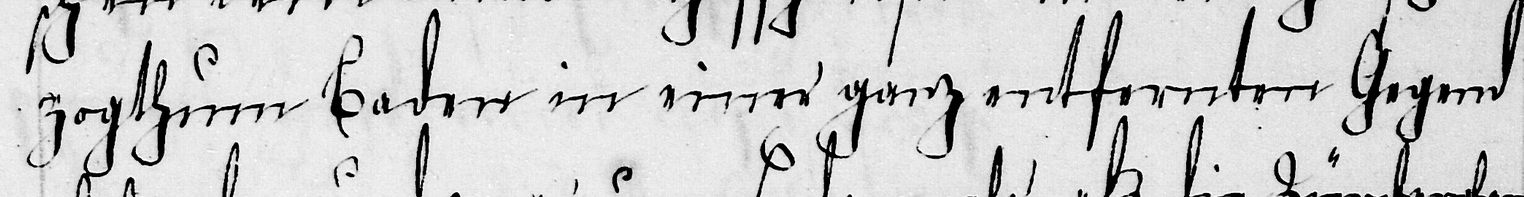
zogthum Baden in einer ganz entfernten Gegend
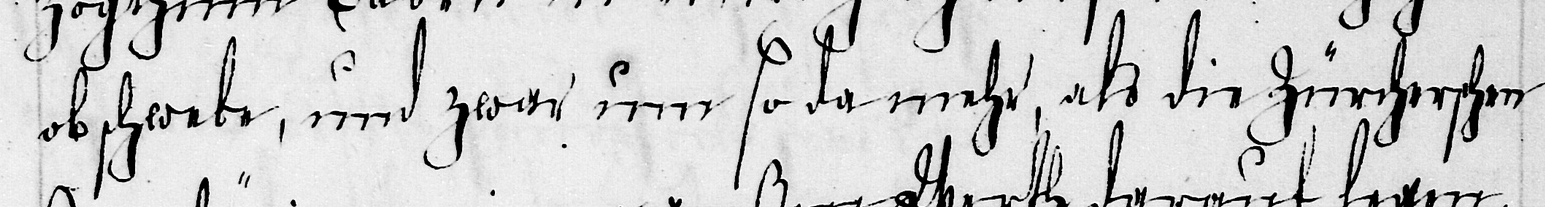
obschwebe, und zwar um so da mehr, als die Zürcherschen
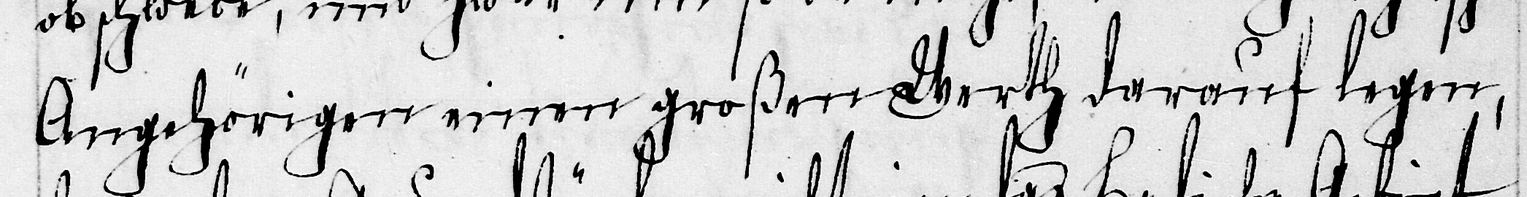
Angehörigen einen großen Werth darauf legen,
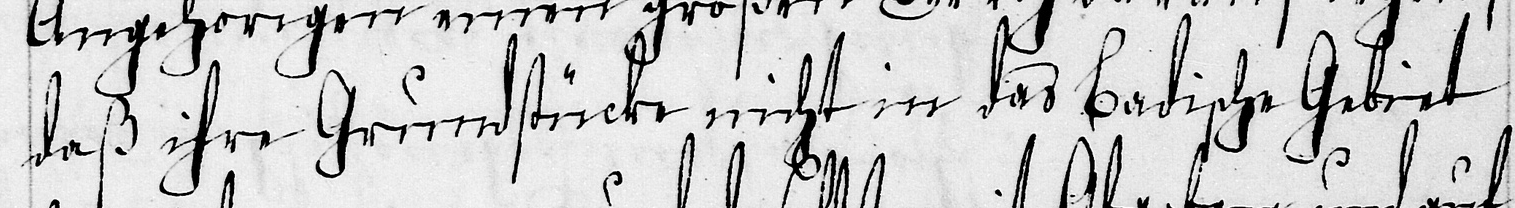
daß ihre Grundstücke nicht in das Badische Gebiet
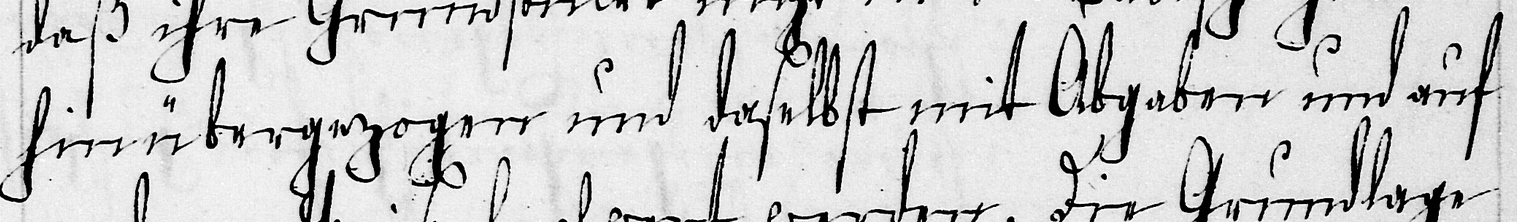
hinübergezogen und daselbst mit Abgaben und auf
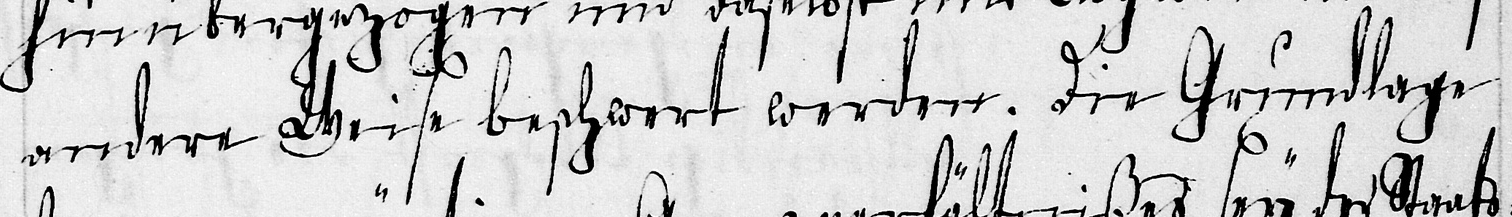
andere Weise beschwert werden. Die Grundlage
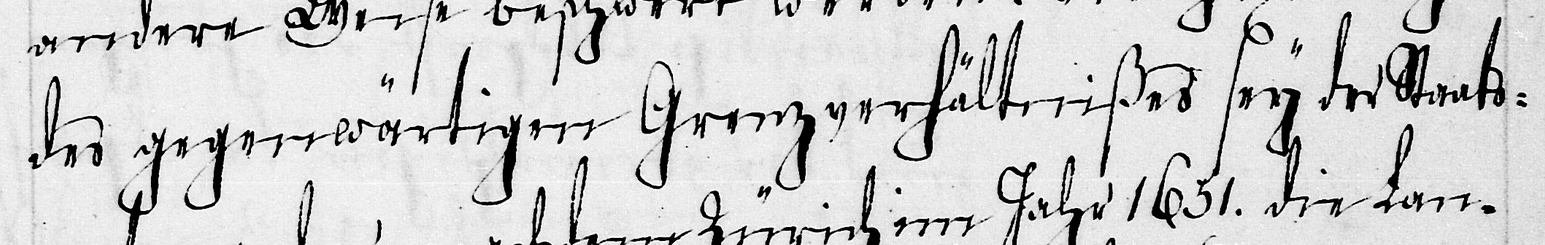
des gegenwärtigen Grenzverhältnißes sey der Staats¬
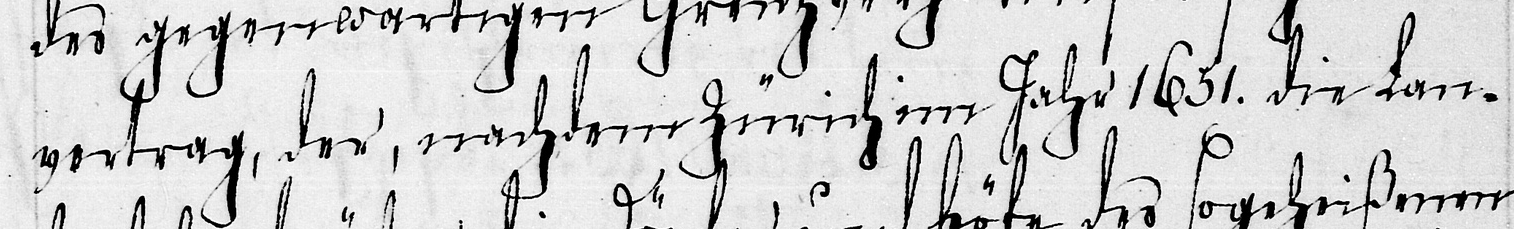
vertrag, der, nachdem Zürich im Jahr 1651. die Lan¬
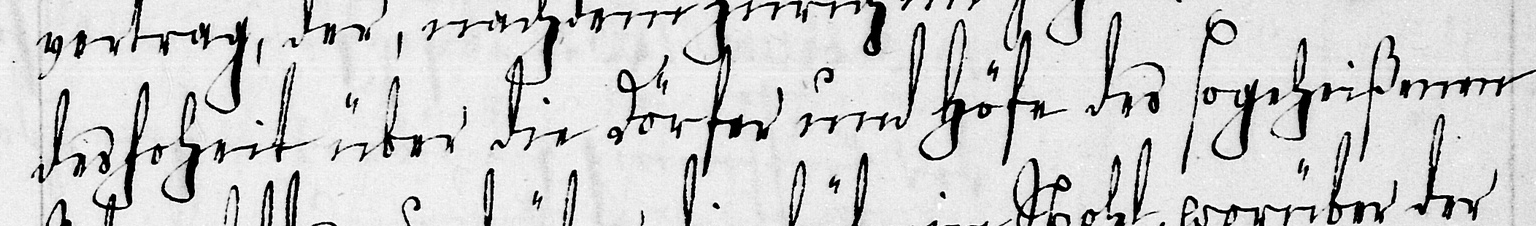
deshoheit über die Dörfer und Höfe des sogeheißenen
